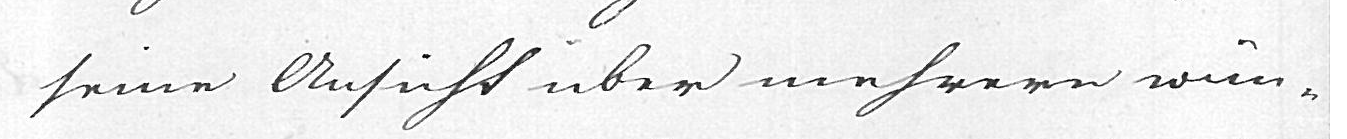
seine Ansicht über mehrere wün-
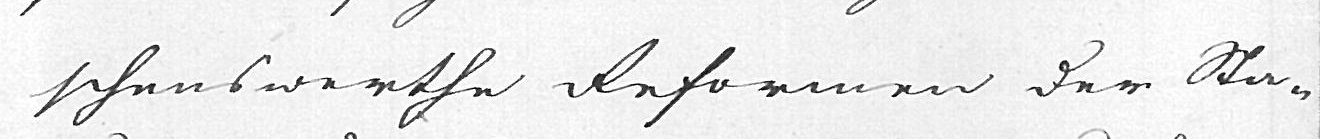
schenswerthe Reformen der Sta-
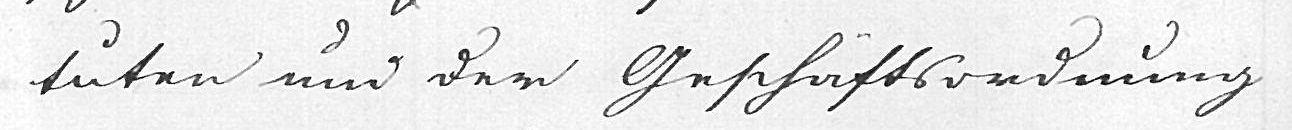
tuten und der Geschäftsordnung
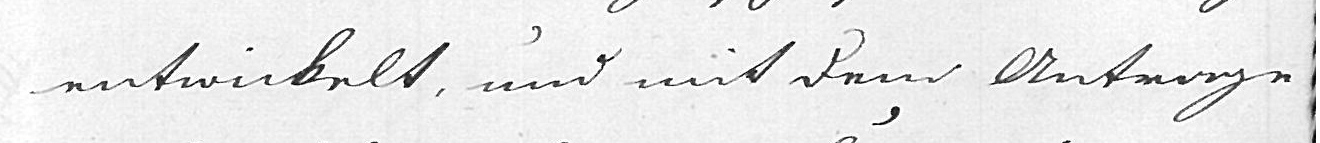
entwickelt, und mit dem Antrage
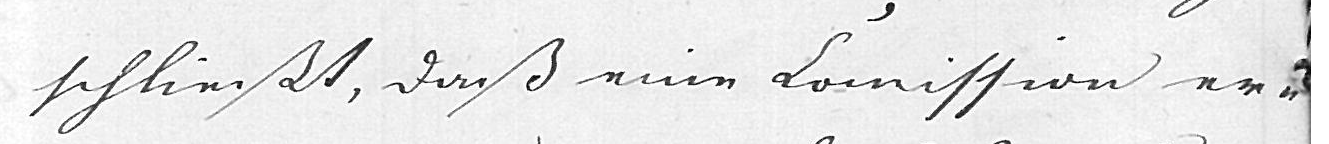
schließt, daß eine Commission er-
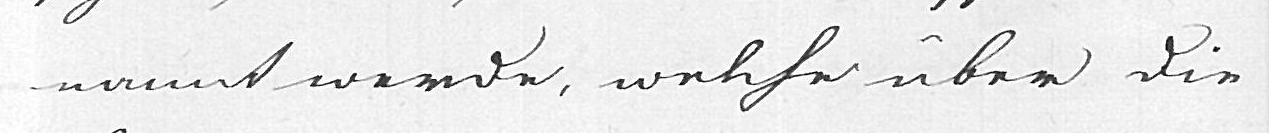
nannt werde, welche über die
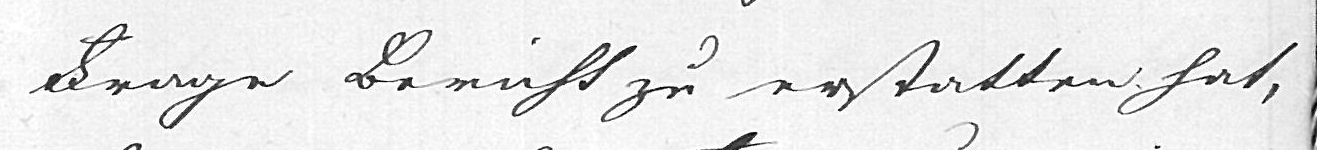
Frage Bericht zu erstatten hat,
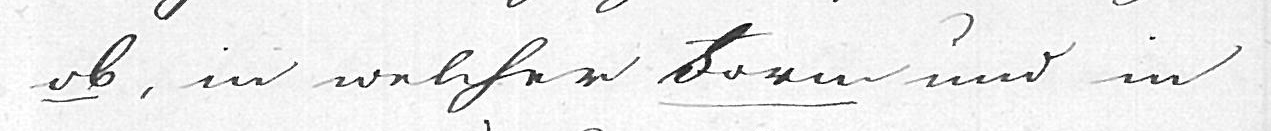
ob, in welcher Form und in
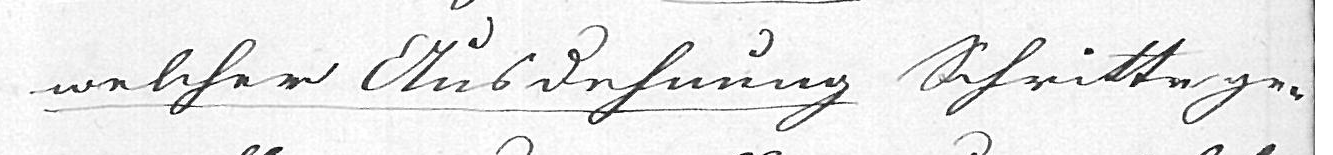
welcher Ausdehnung Schritte ge-
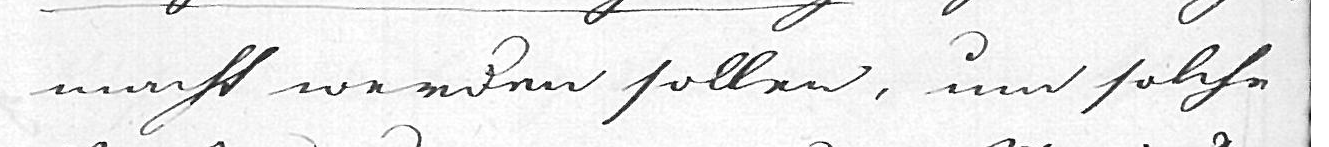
macht werden sollen, um solche
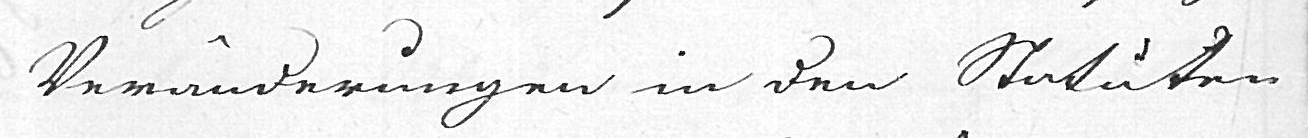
Veränderungen in den Statuten
